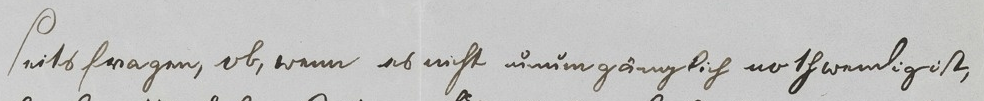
seits fragen, ob, wenn es nicht unumgänglich nothwendig ist,
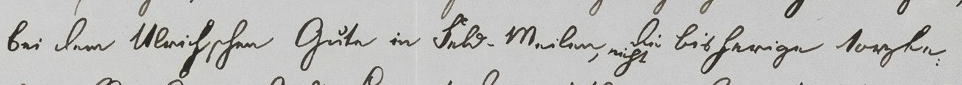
bei dem Ulrichschen Gute in Feld-Meilen, nicht die bisherige topfe-
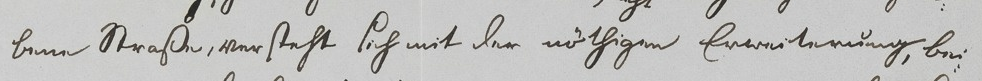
bene Straße, versteht sich mit der nöthigen Erweiterung, bei-
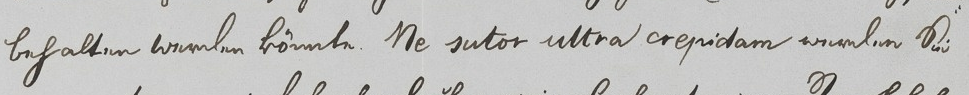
behalten werden könnte. Ne sutor ultra crepidam werden Sie
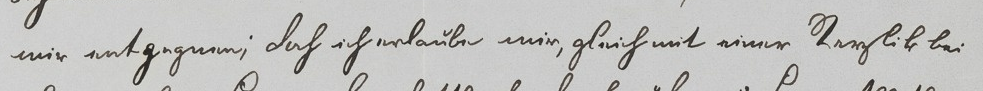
mir entgegnen; doch ich erlaube mir, gleich mit einer Replik bei
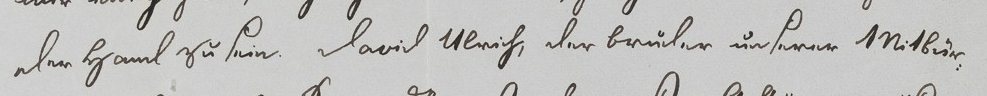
der Hand zu sein. David Ulrich, der Bruder unserer Mitbür-
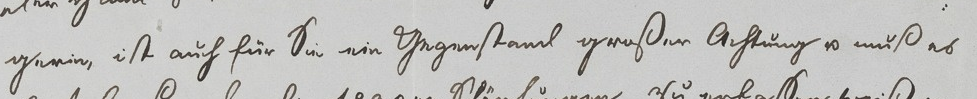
gerin, ist auch für Sie ein Gegenstand großer Achtung & muß es
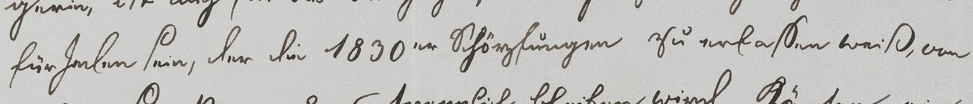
für Jeden sein, der die 1830er Schöpfungen zu erfassen weiß, von
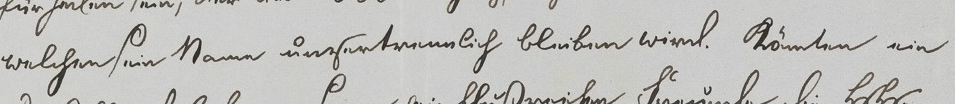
welchen sein Name unzertrennlich bleiben wird. Könnten ein
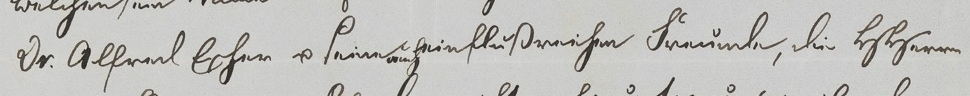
Dr. Alfred Escher & seine auch einflußreichen Freunde, die HHerren
